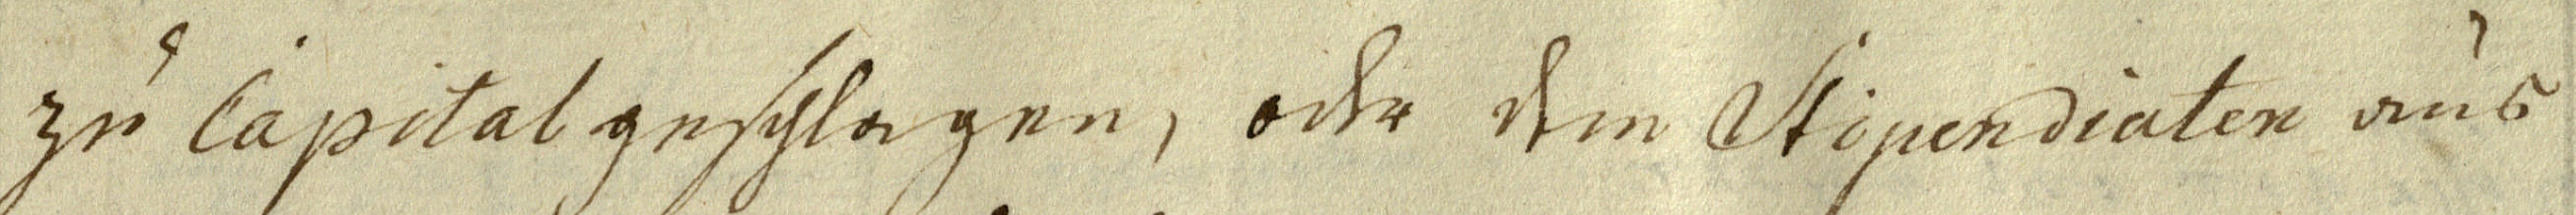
zu Capital geschlagen, oder dem Stipendiaten aus¬
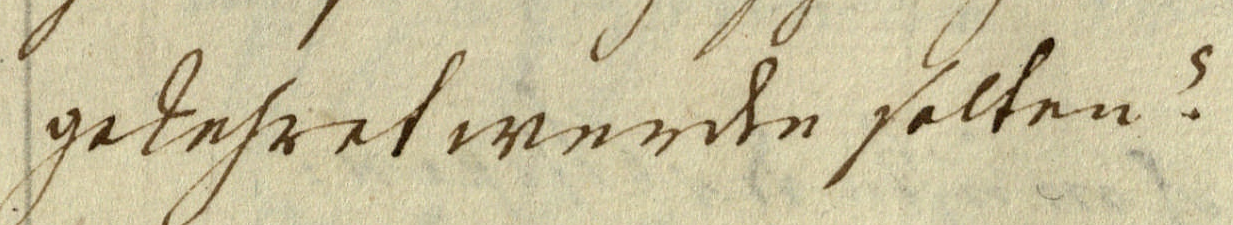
gekehret werden solten!
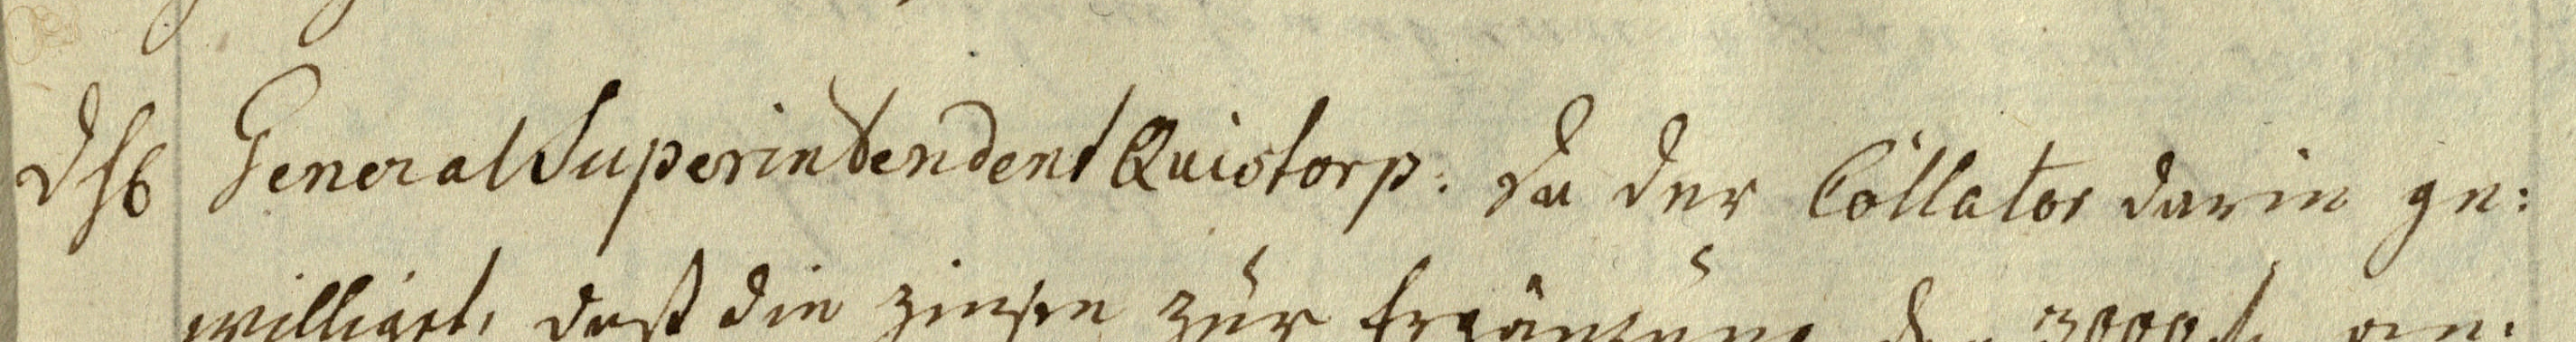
dh GeneralSuperintendent Quistorp: da der Collator darin ge¬
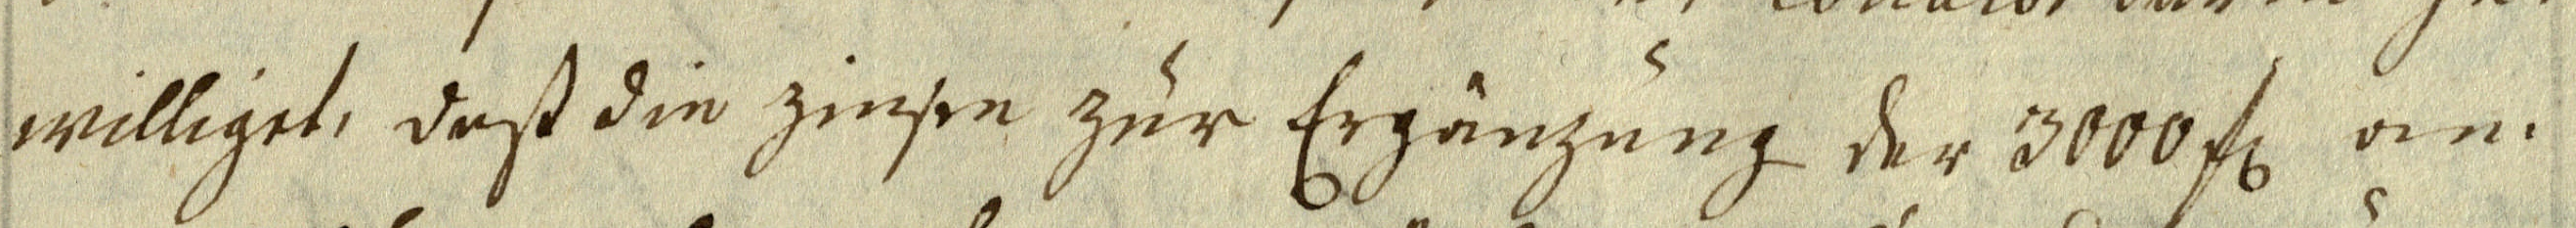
williget, daß die Zinsen zur Ergänzung der 3000 s an¬
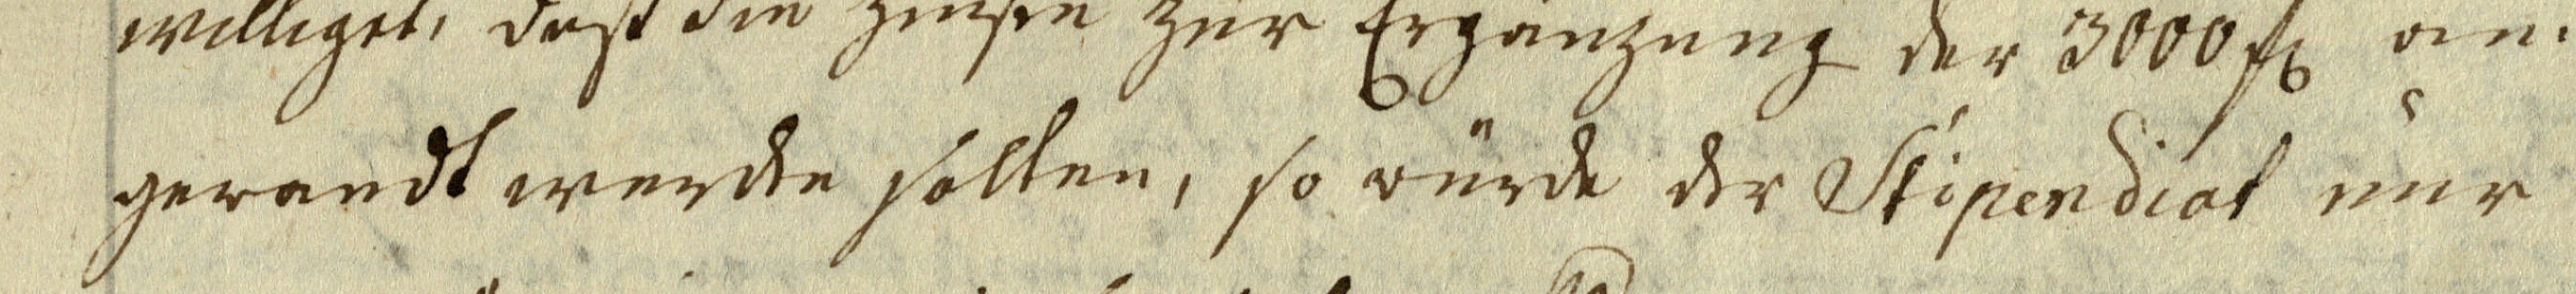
gewandt werden sollen, so würde der Stipendiat nur
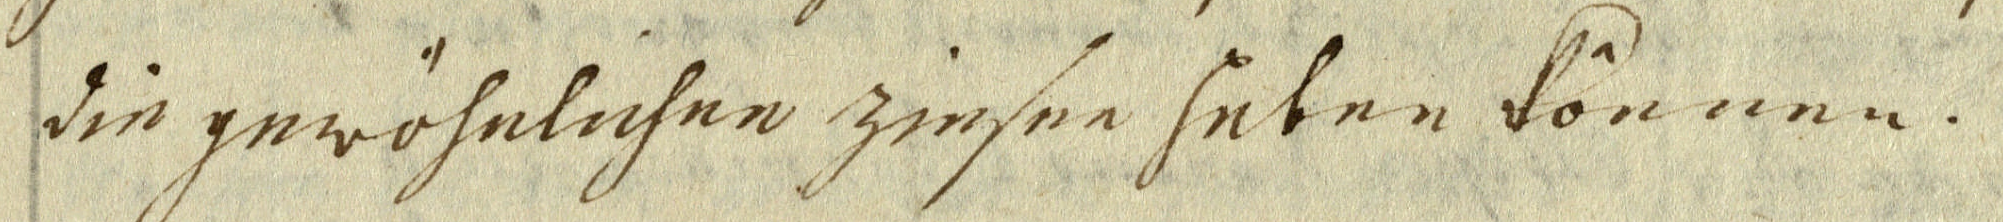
die gewöhnlichen Zinsen heben können.
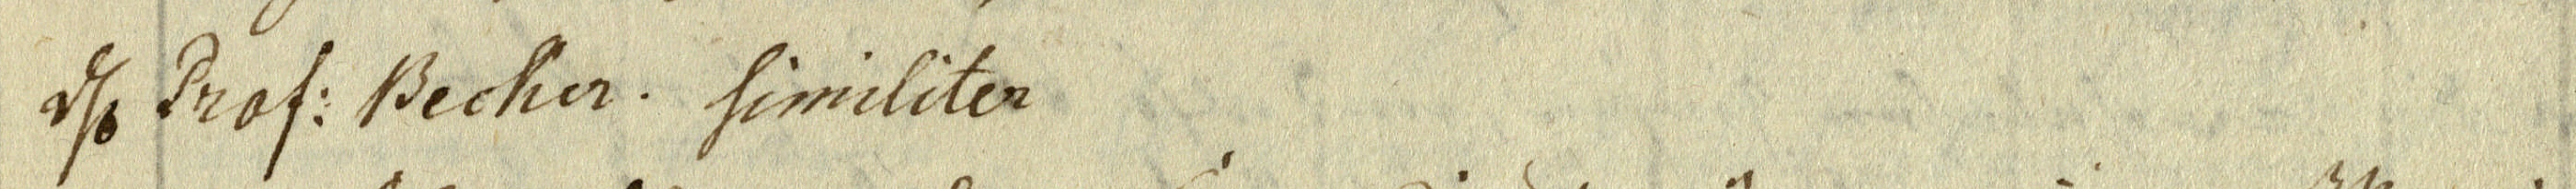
dh Prof: Becker. similiter
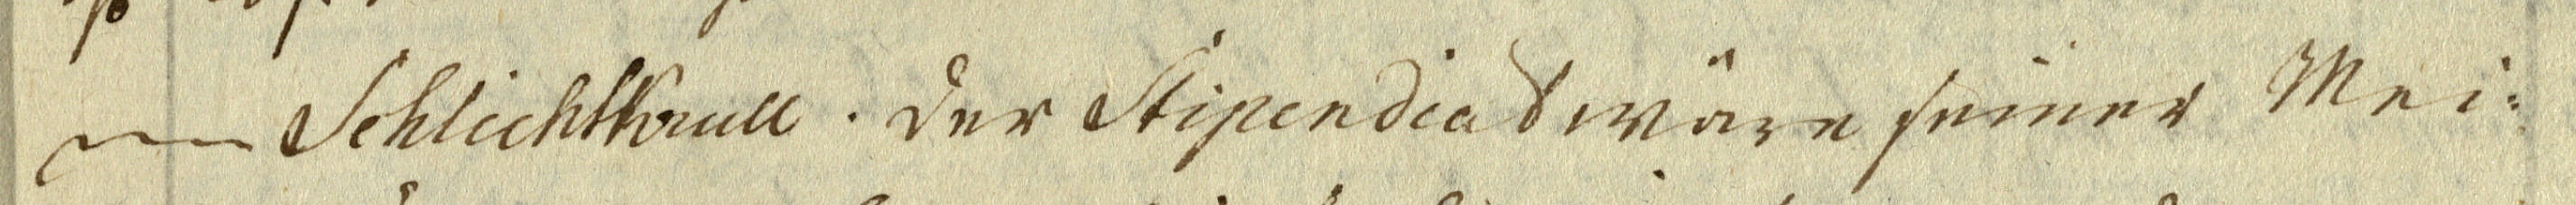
Schlichtkrull: der Stipendiat wäre seiner Mei¬
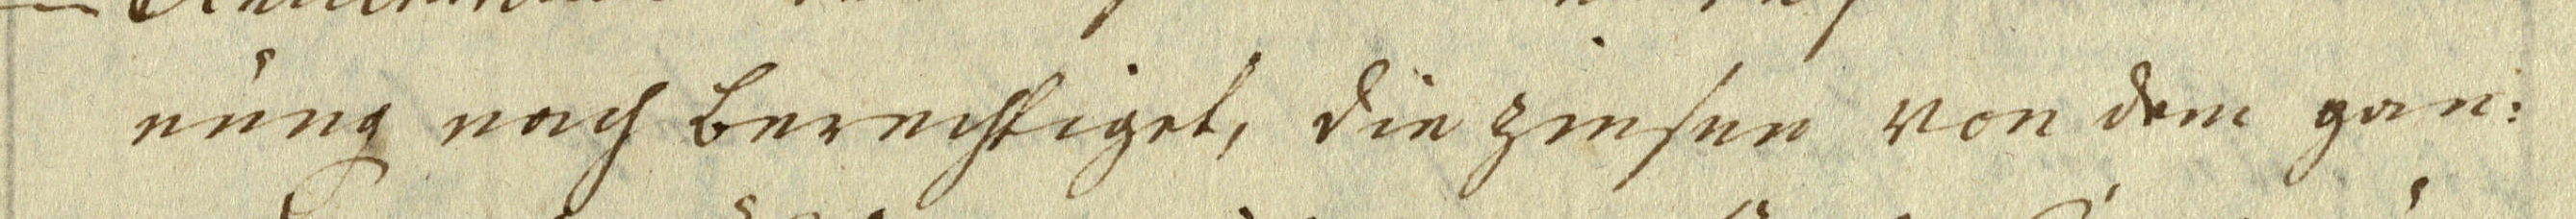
nung nach berechtiget, die zinsen von dem gan¬
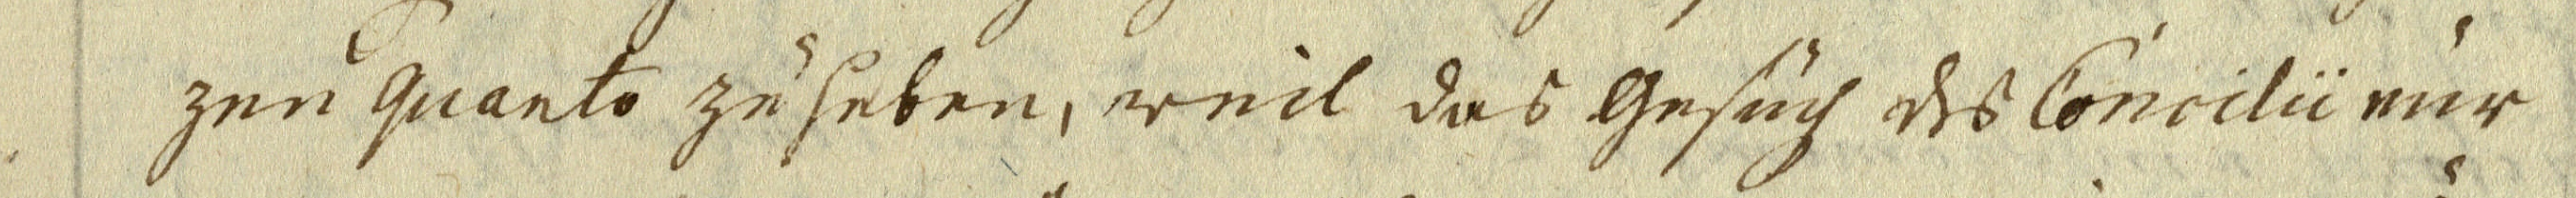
zen Quanto zu heben, weil das Gesuch des Concilii nur
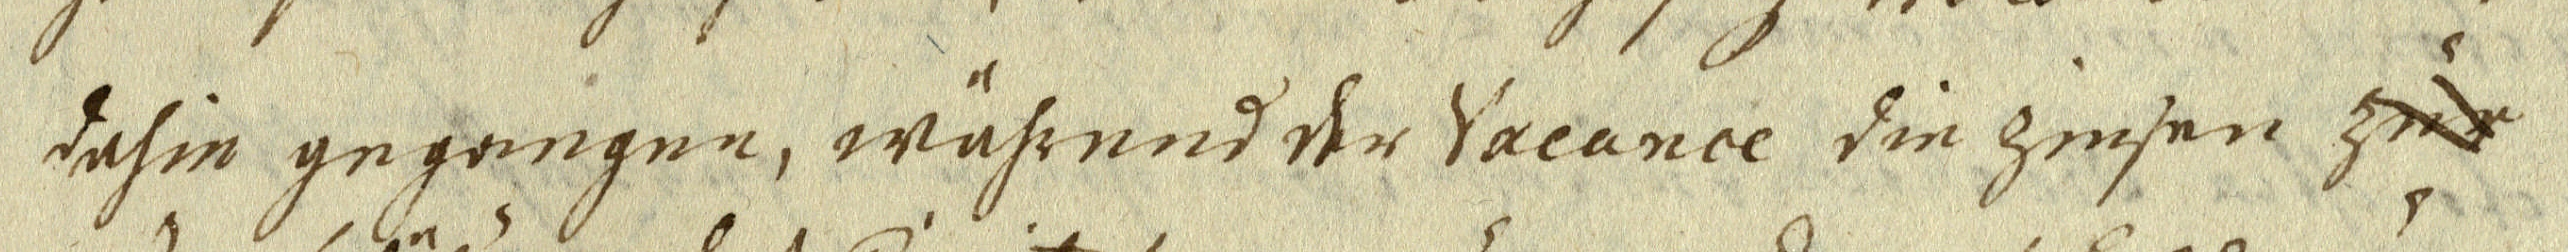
dahin gegangen, während der Vacance die zinsen zur
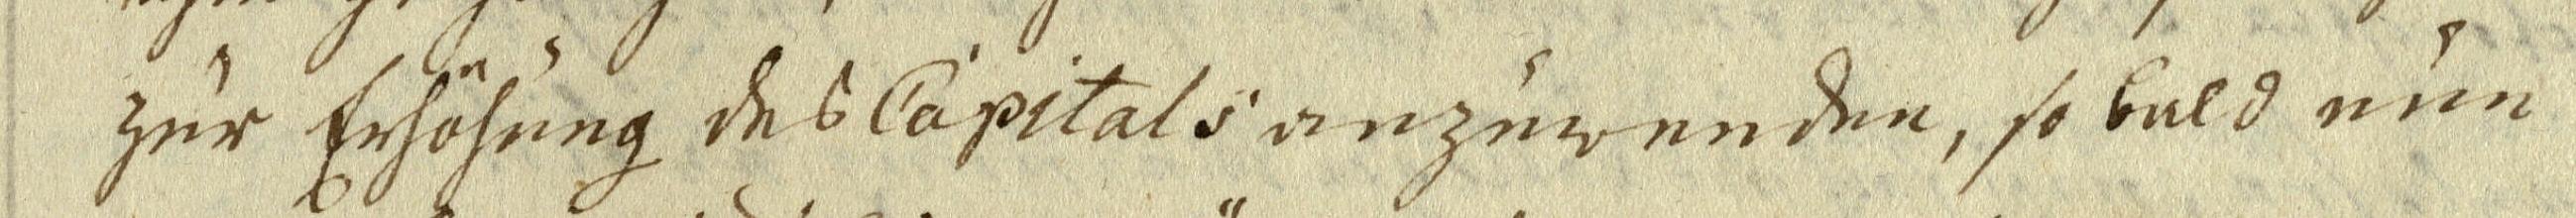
zur Erhöhung des Capitals anzuwenden, so bald nun
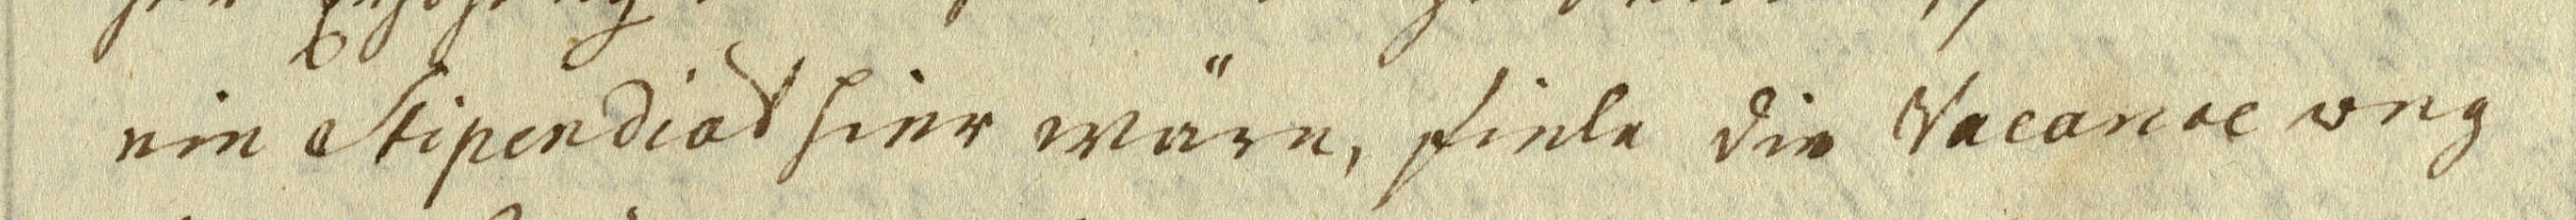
ein Stipendiat hier wäre, fiele die Vacance weg
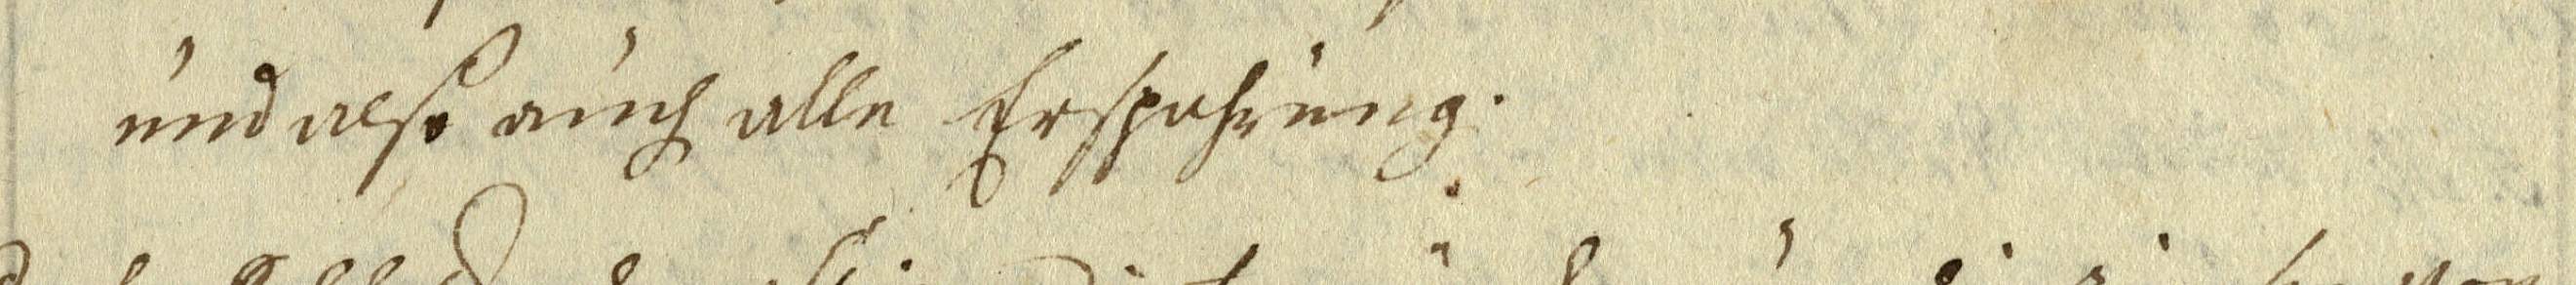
und also auch alle Erspahrung.
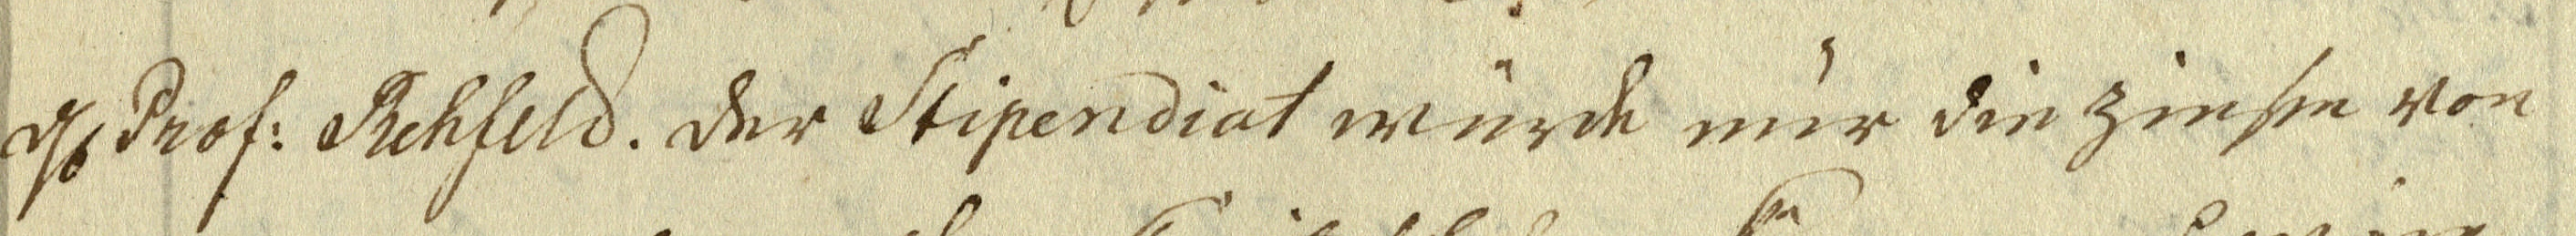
dh Prof: Rehfeld. der Stipendiat würde nur die Zinsen von
